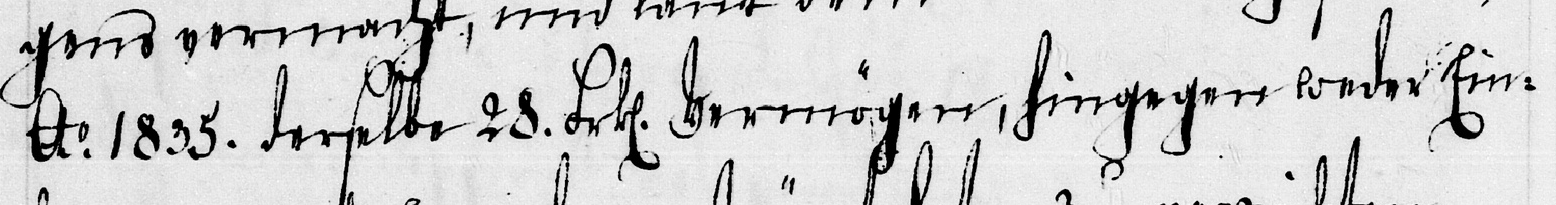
Ao. 1835. derselbe 28. Frk[en]. Vermögen, hingegen weder Ein¬
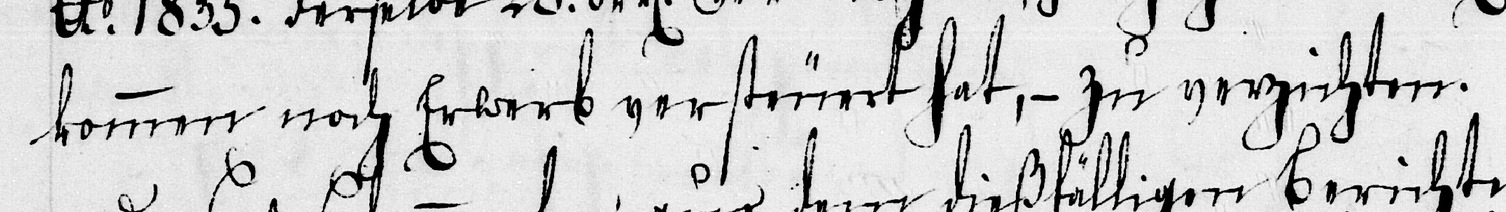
kommen noch Erwerb versteuert hat, – zu verzichten.
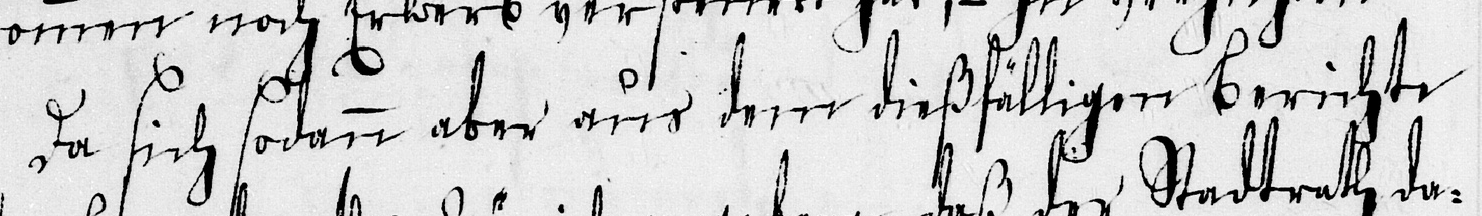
Da sich sodann aber aus dem dießfälligen Berichte
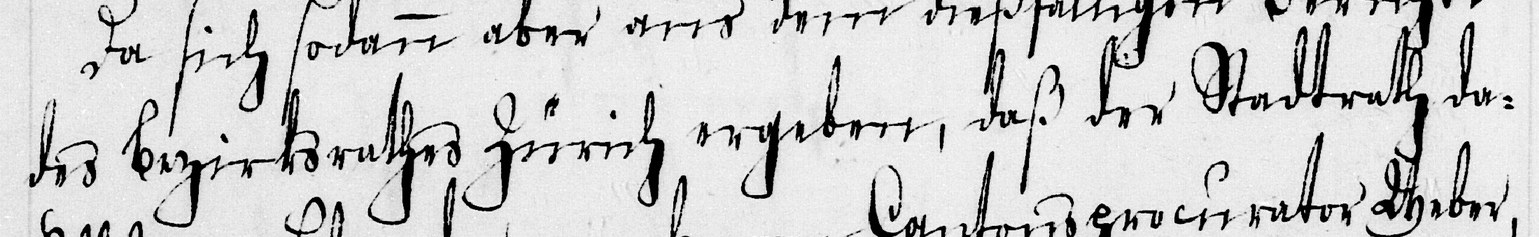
des Bezirksrathes Zürich ergeben, daß der Stadtrath da¬
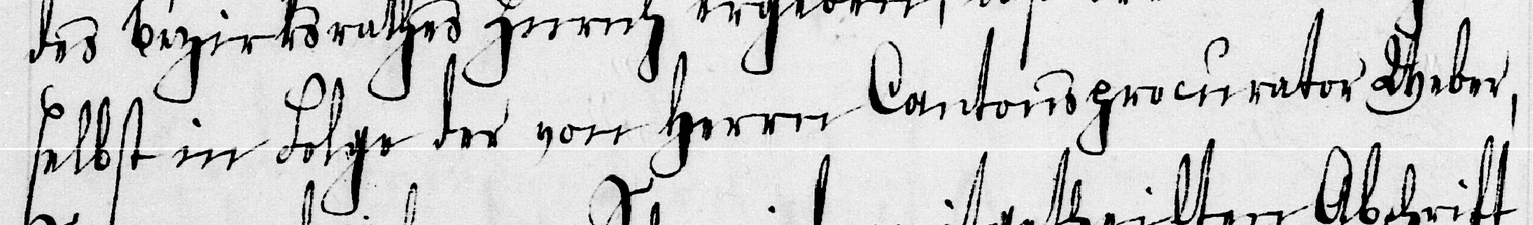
selbst in Folge der von Herrn Cantonsprocurator Weber,
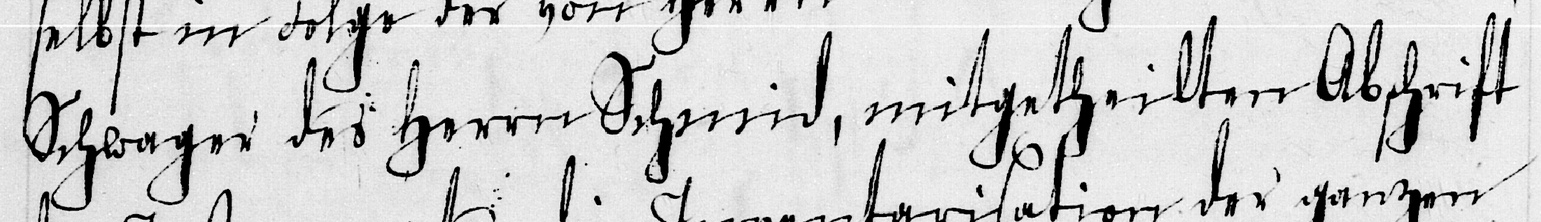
Schwager des Herrn Schmid, mitgetheilten Abschrift
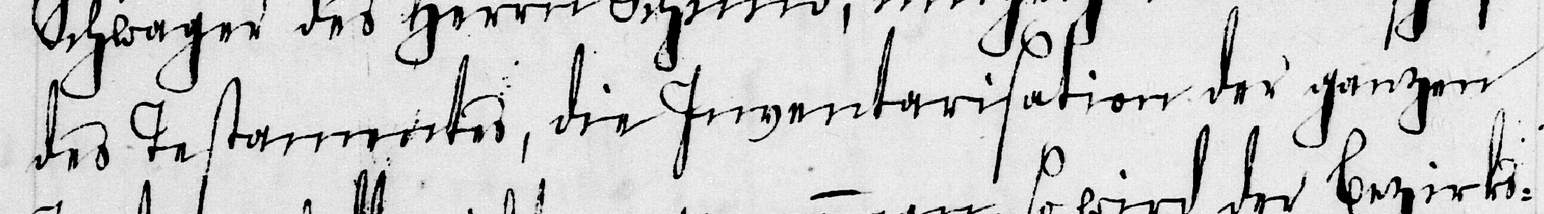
des Testamentes, die Inventarisation der ganzen
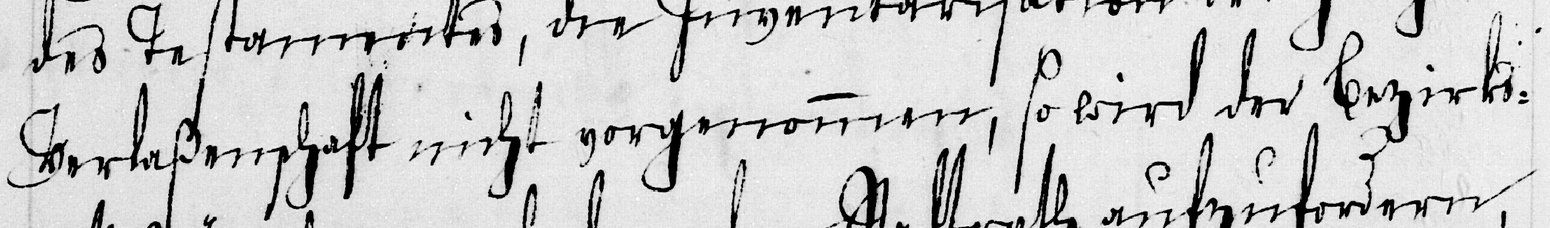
Verlaßenschaft nicht vorgenommen, so wird der Bezirks¬
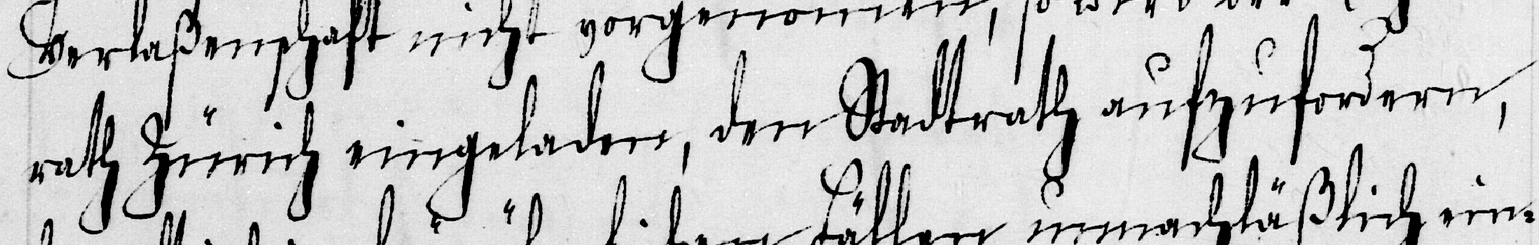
rath Zürich eingeladen, den Stadtrath aufzufordern,
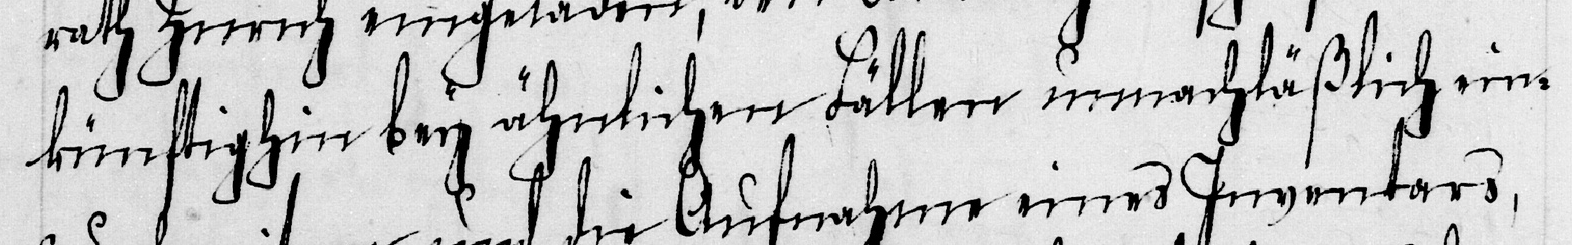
künftighin bey ähnlichen Fällen unnachläßlich ein¬
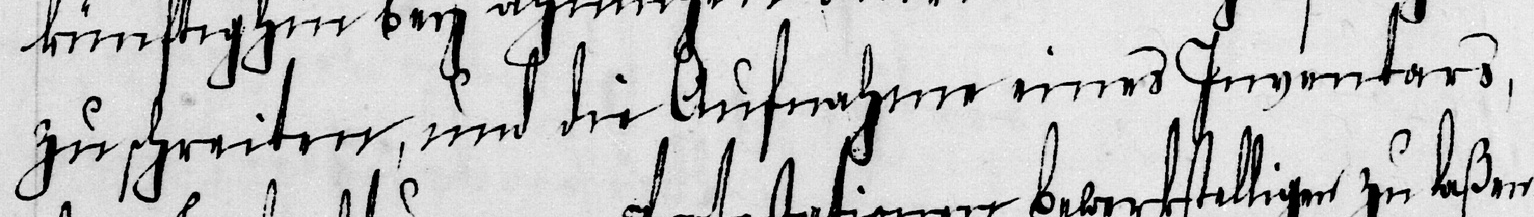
zuschreiten, und die Aufnahme eines Inventars
